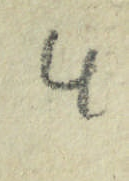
4
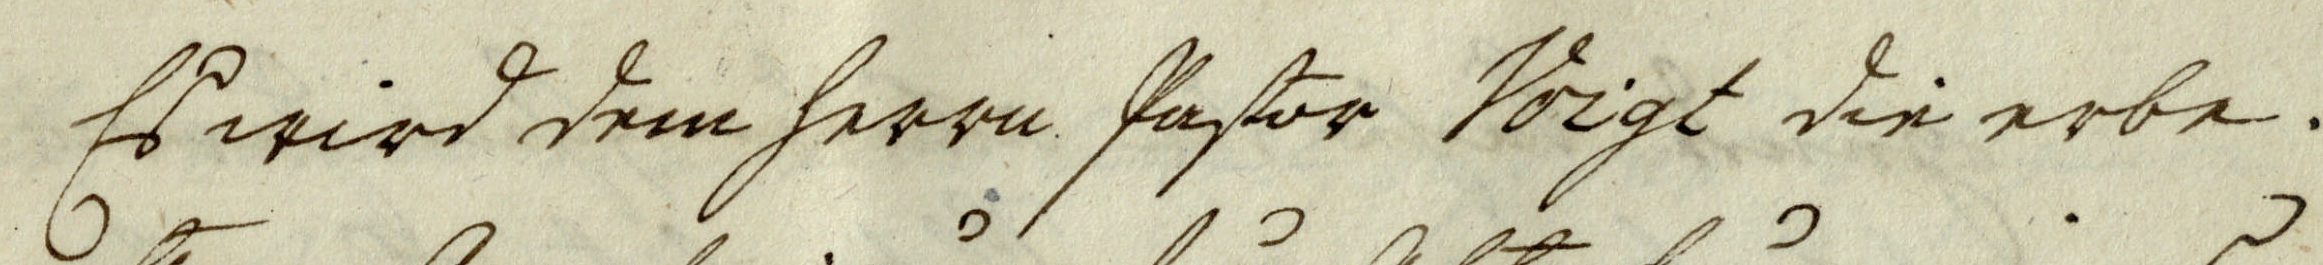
Es wird dem Herrn Pastor Voigt die erbe¬
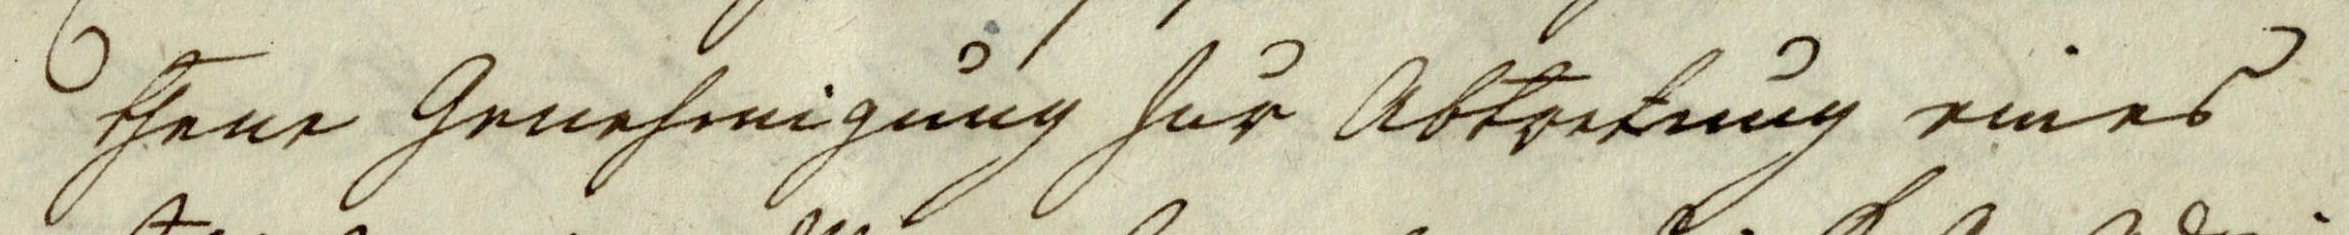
thene Genehmigung zur Abtretung eines
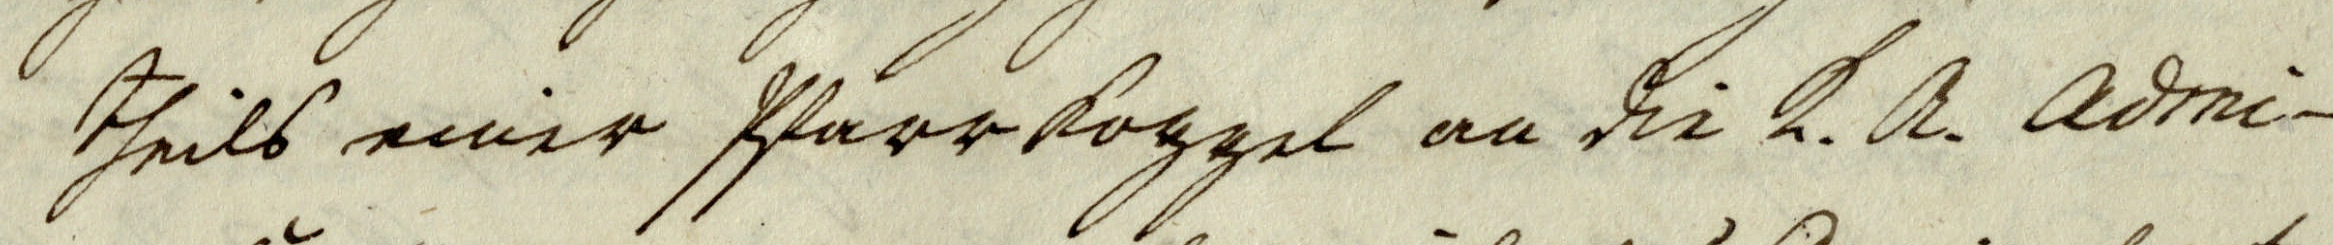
Theils einer Pfarrkoppel an die K. A. Admi¬
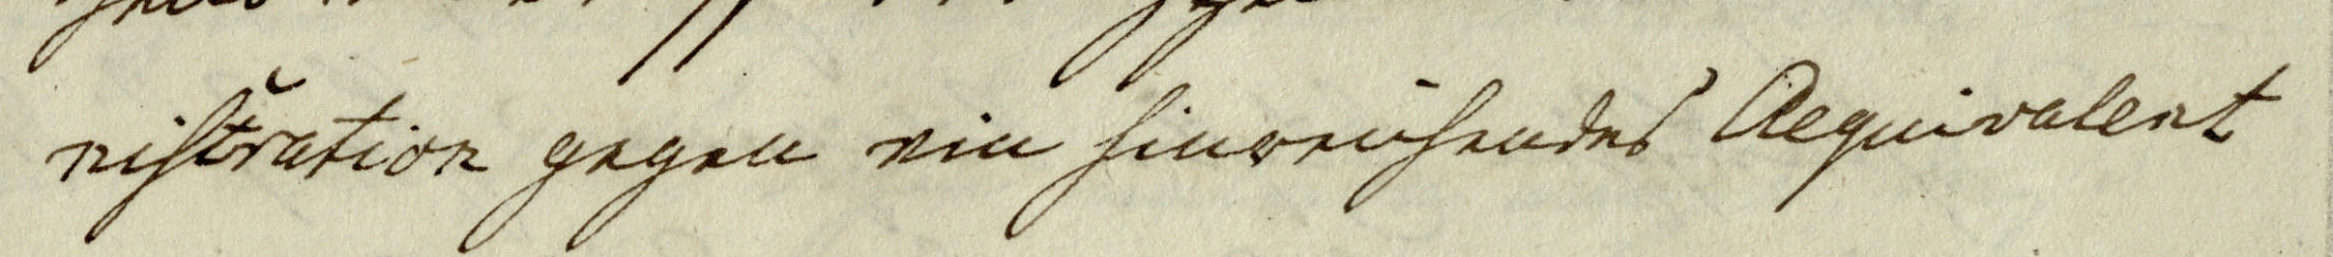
nistration gegen ein hinreichendes Aequivalent
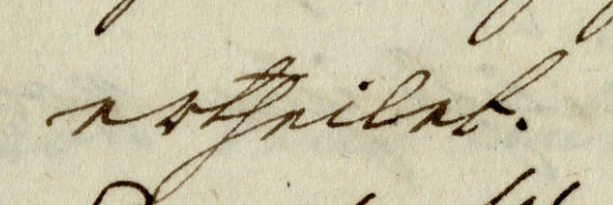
ertheilt.
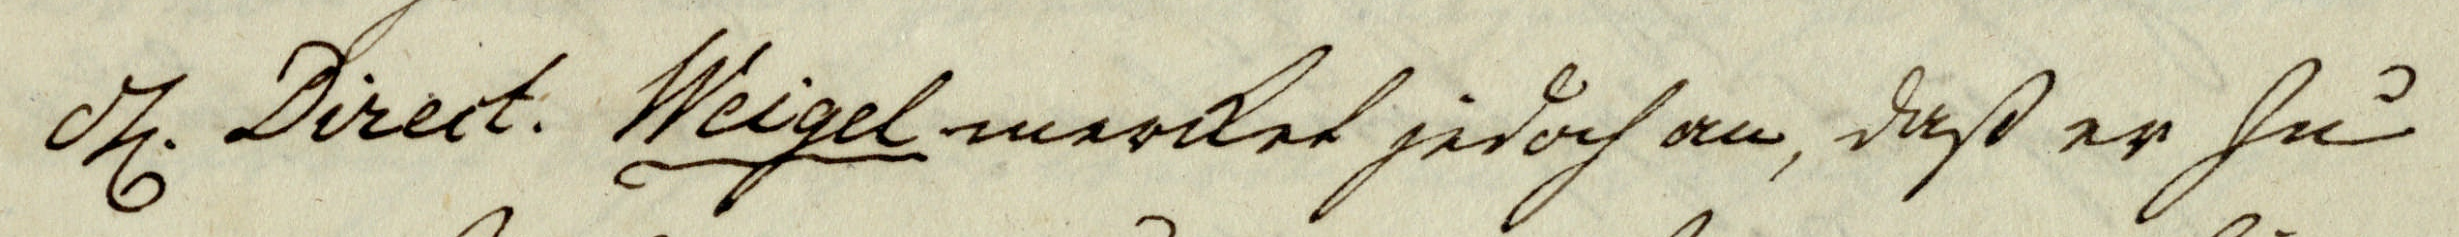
dh. Direct. Weigel merket jedoch an, daß er zu
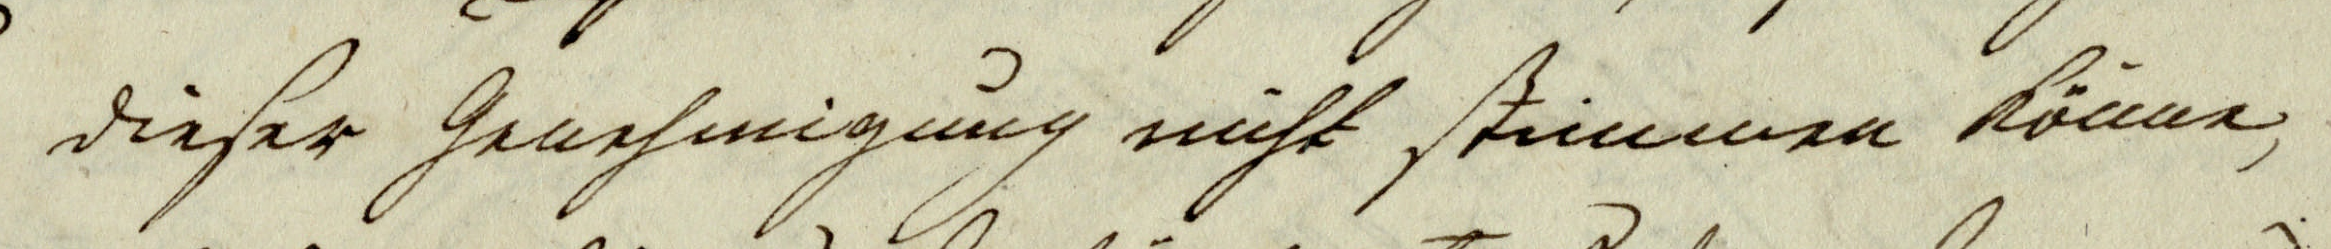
dieser Genehmigung nicht stimmen könne,
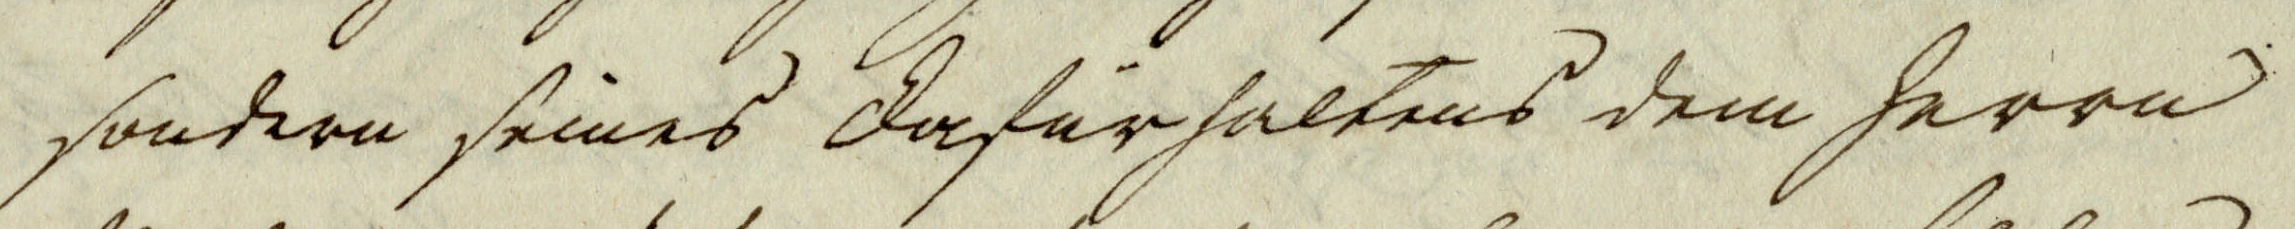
sondern seines Dafürhaltens dem Herrn
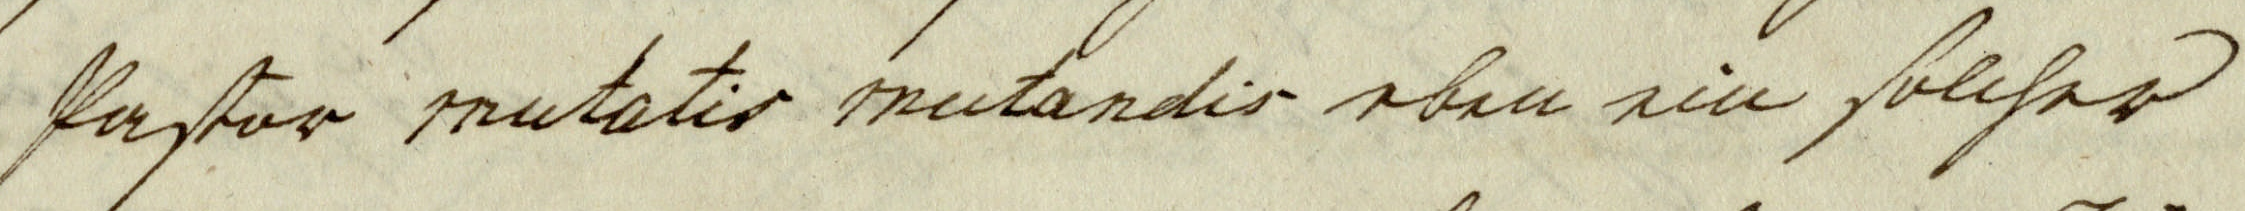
Pastor mutatis mutandis eben ein solcher
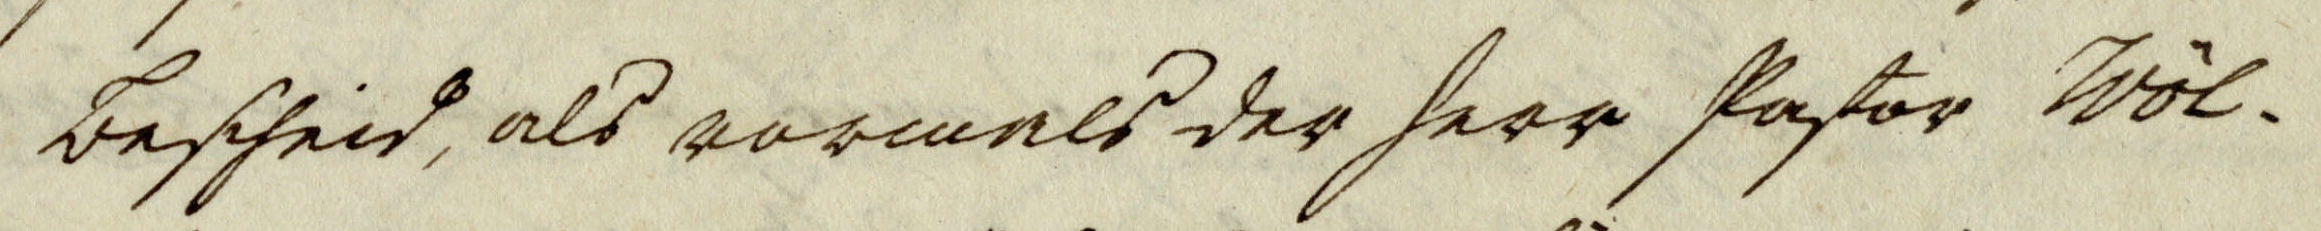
Bescheid, als vormals der Herr Pastor Wöl¬
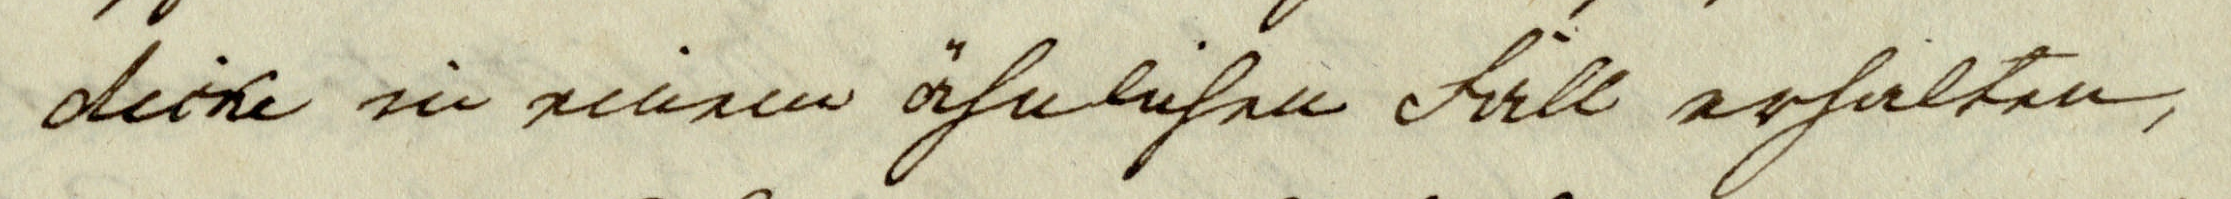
dicke in einem ähnlichen Fall erhalten,
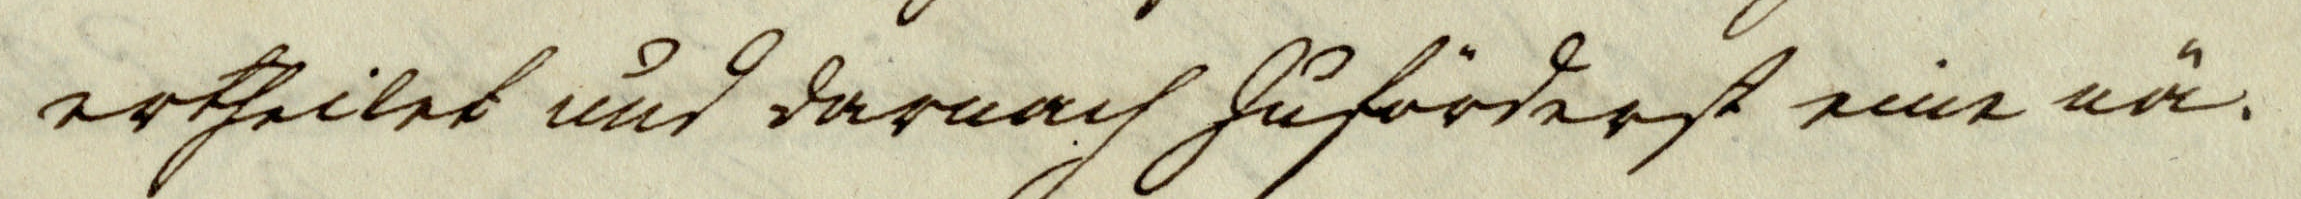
ertheilet und darauf zuförderst eine nä¬
